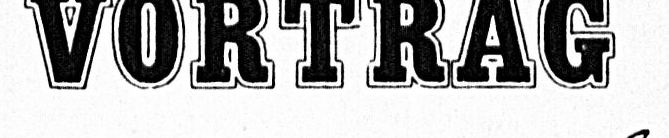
VORTRAG
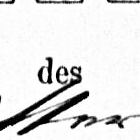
des
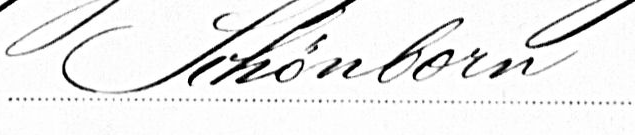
Schönborn
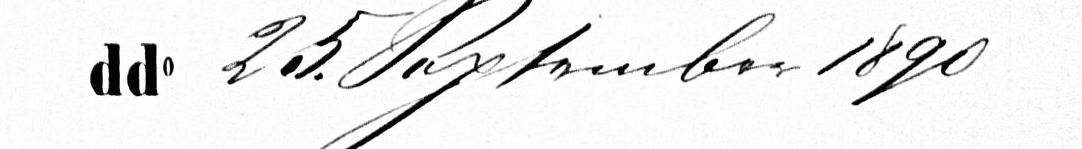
dd° 25. September 1890
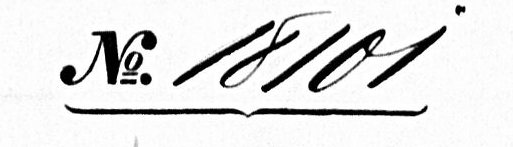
N° 18101
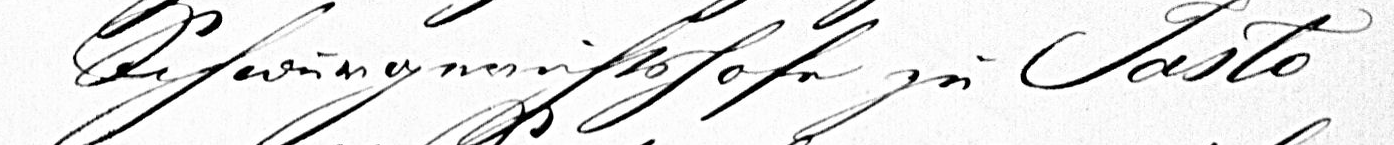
Schwurgerichtshofe zu Tasto
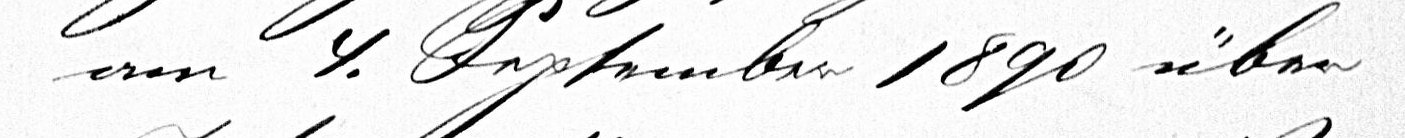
am 4. September 1890 über
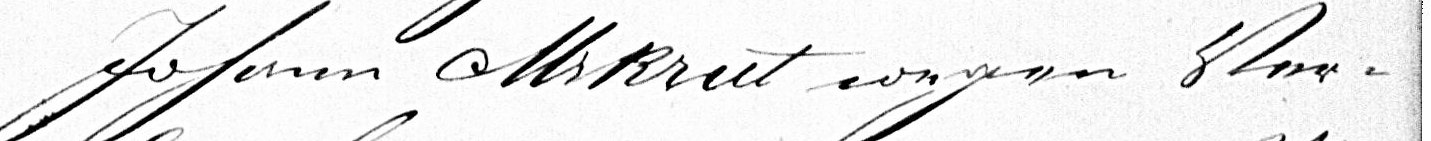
Johann Mikrut wegen Ver¬
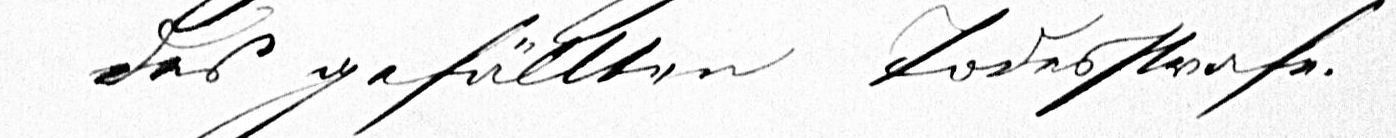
des gefällten Todesstrafe.
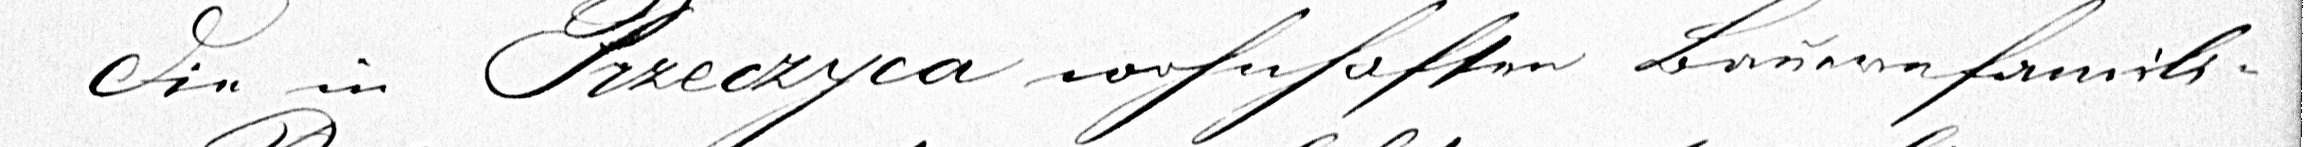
Die in Przeczyca wohnhaften Bauernfamili¬
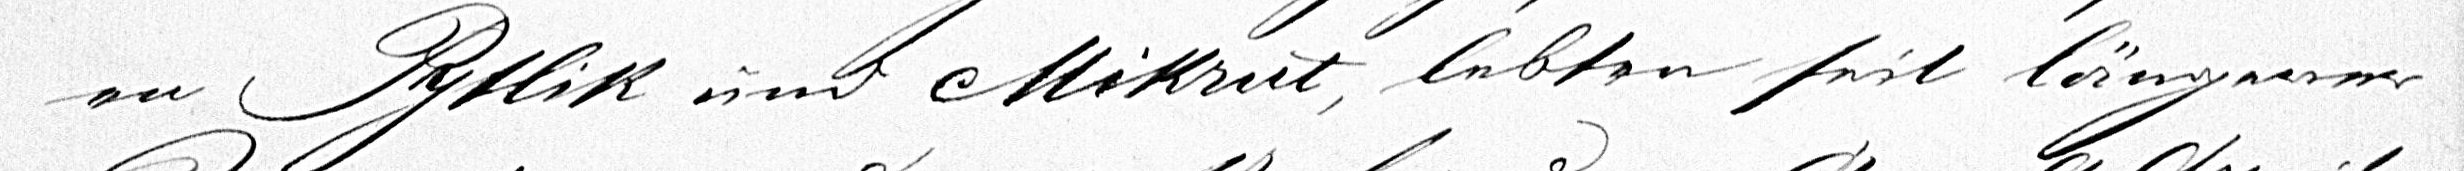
en Pytlik und Mikrut, lebten seit längerer
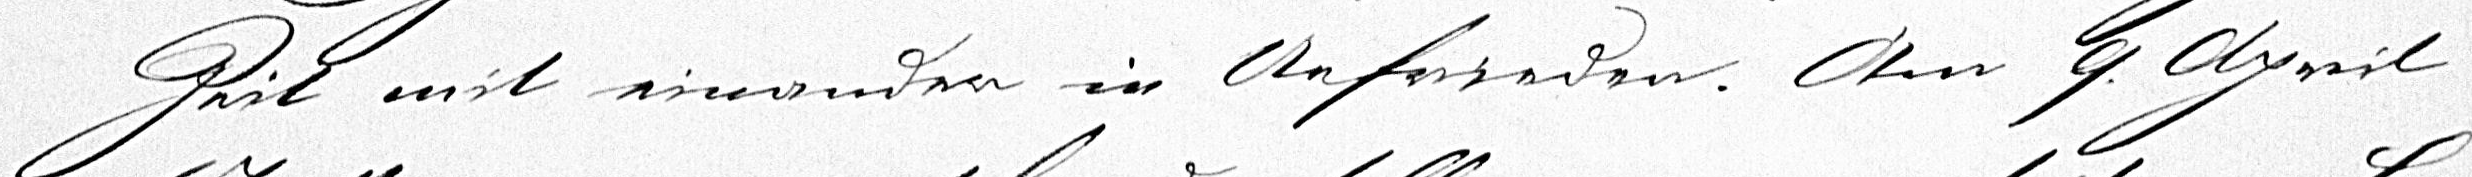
Zeit mit einander in Unfrieden. Am 9. April
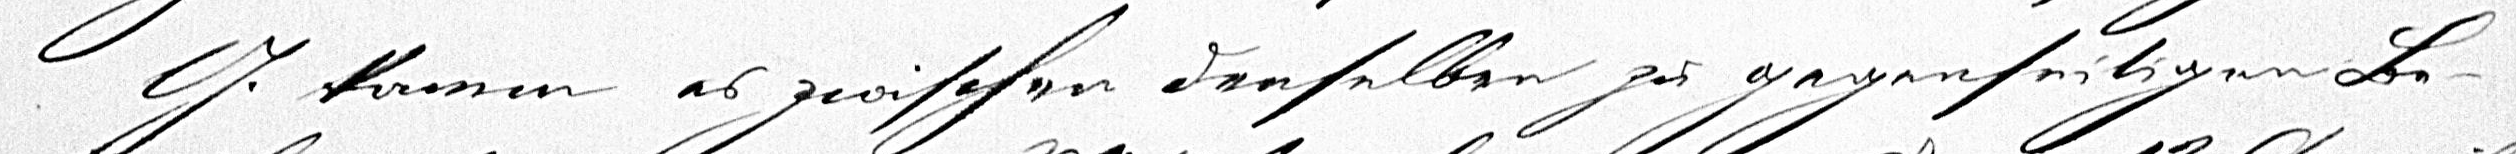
G. kamm es zwischen denselben zu gegenseitigen Be¬
